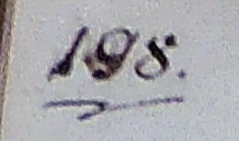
198.
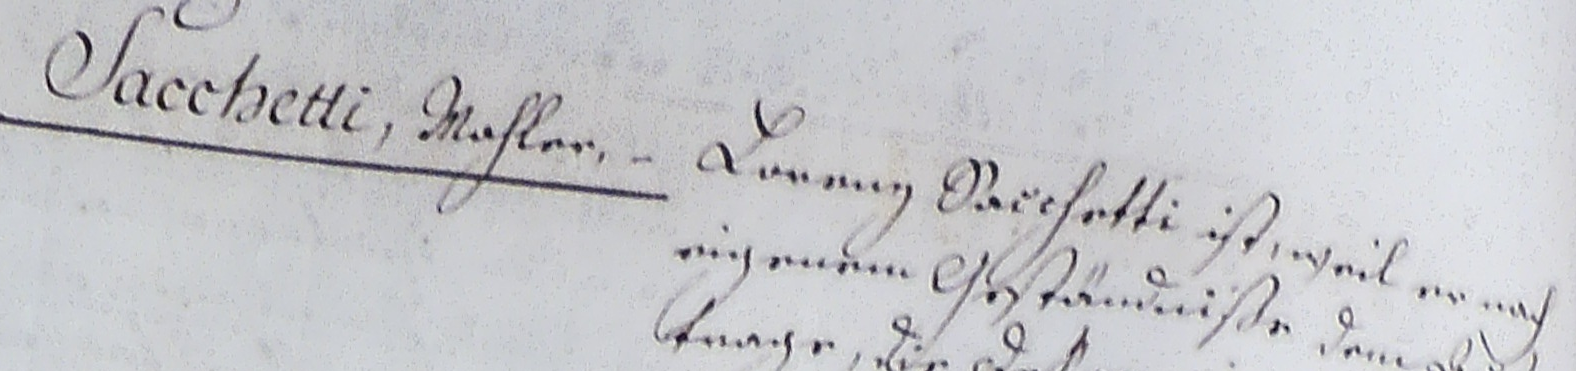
Sacchetti, Mahler. .. Lorenz Sacchetti ist weil er nach
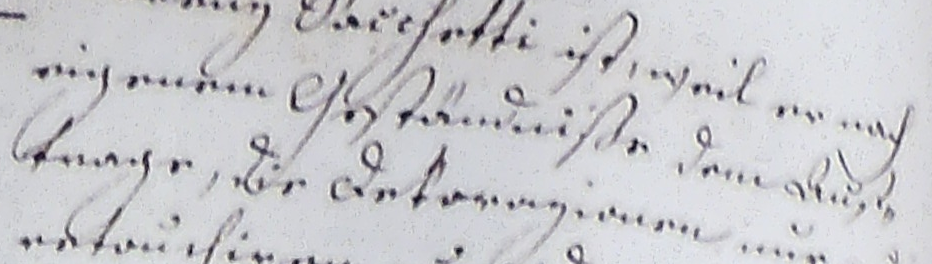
eigenem Geständniße dem Auf¬
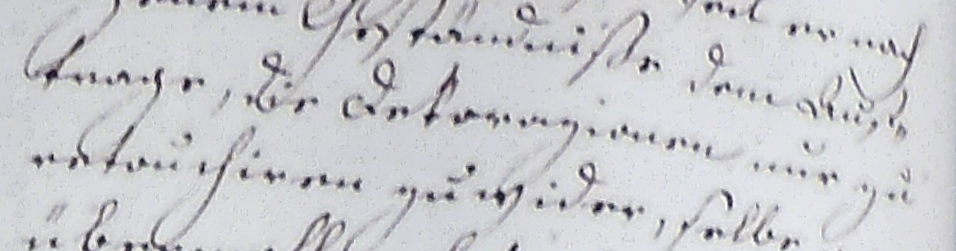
trage, die Dekorazionen nur zu
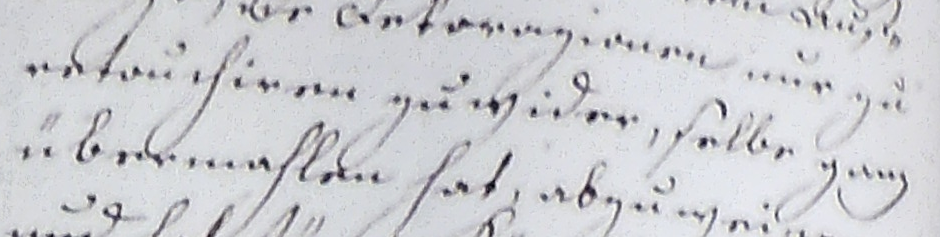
retouchiren zuwider, selbe ganz
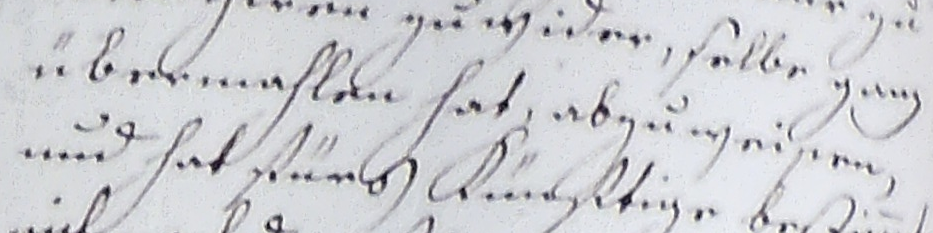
übermahlen hat, abzuweisen,
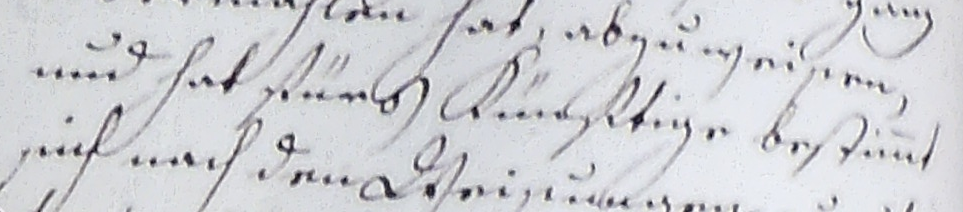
und hat fürs Künftige bestim̅t
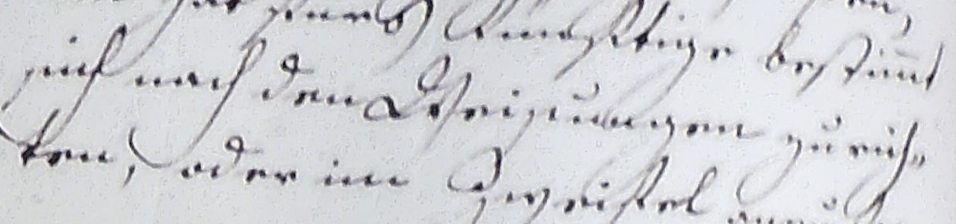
sich nach den Weisungen zurich¬
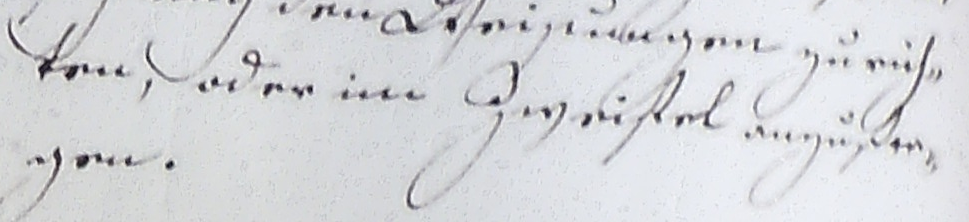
ten, oder im Zweifel anzufra¬,
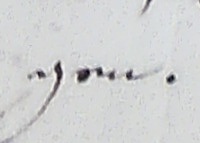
gen.
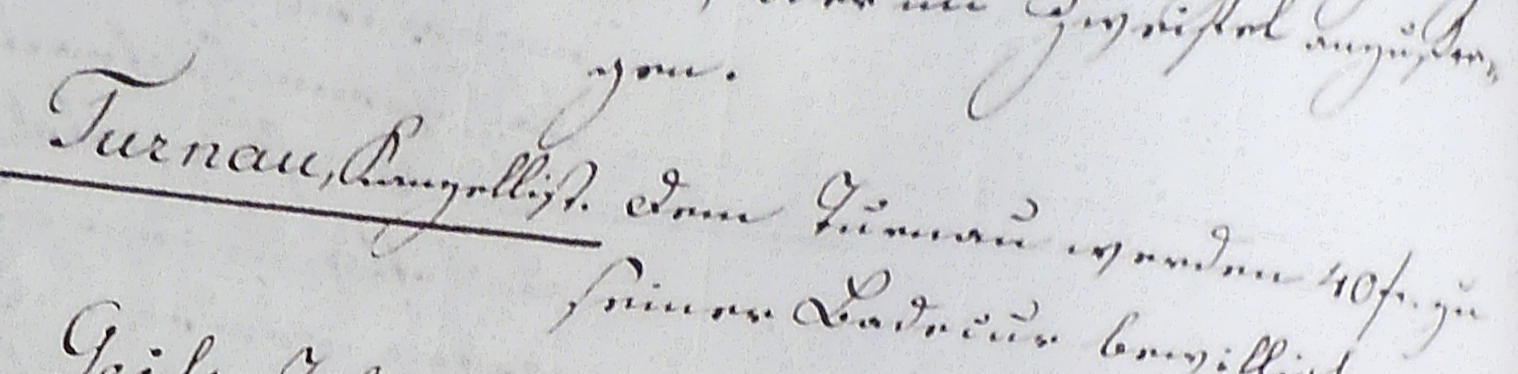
Turnau, Kanzellist. Dem Turnau werden 40fr. zu
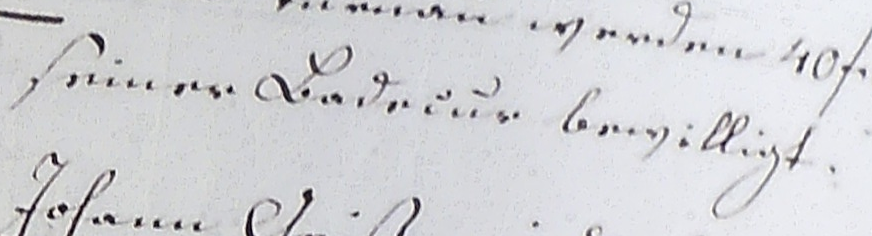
seiner Badecur bewilligt.
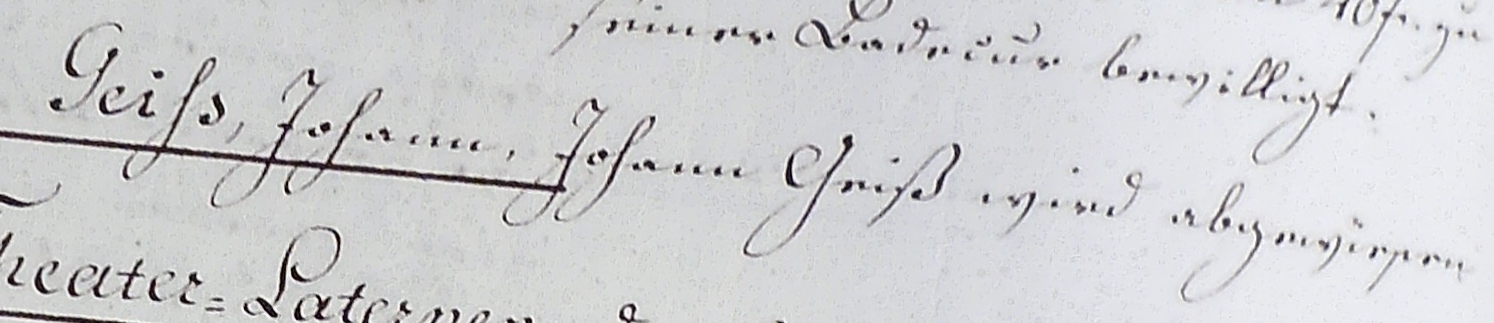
Geiss, Johann. Johann Geiß wird abgewiesen.
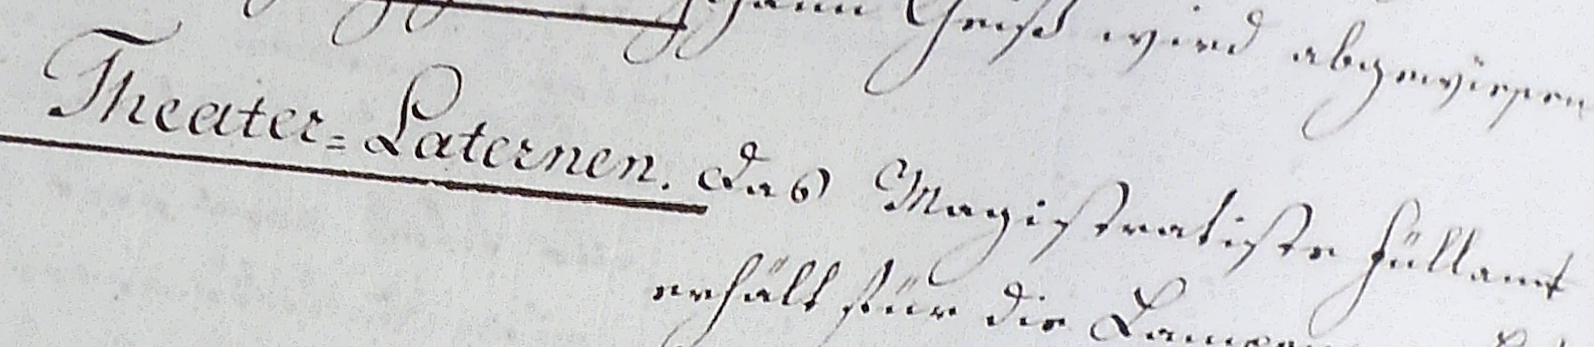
Theater‗Laternen. Das Magistratiste Füllamt
